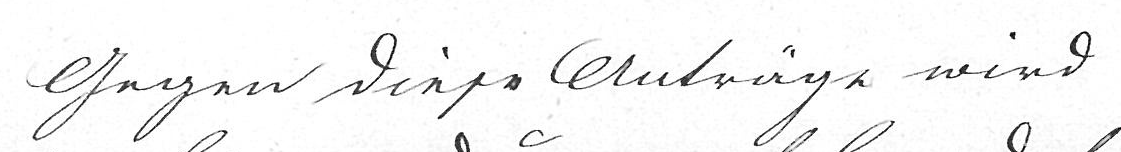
Gegen diese Anträge wird
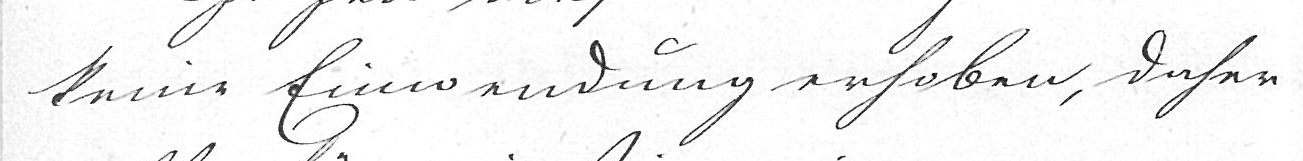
keine Einwendung erhoben, daher
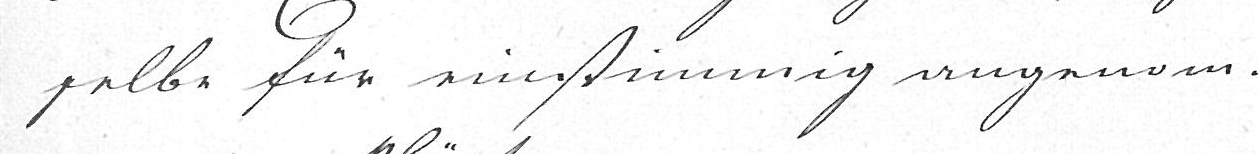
selbe für einstimmig angenom-
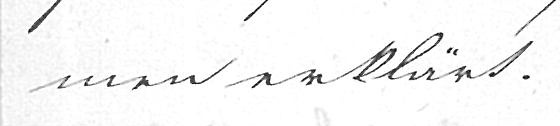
men erklärt.
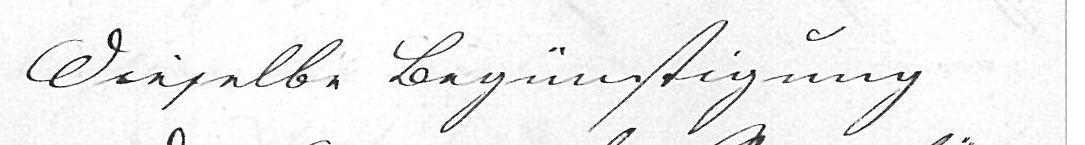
Dieselbe Begünstigung
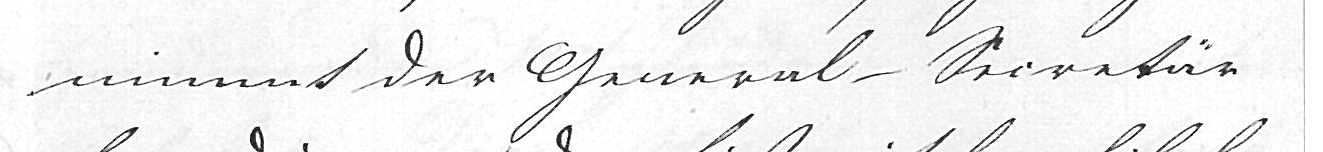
nimmt der General-Secretär
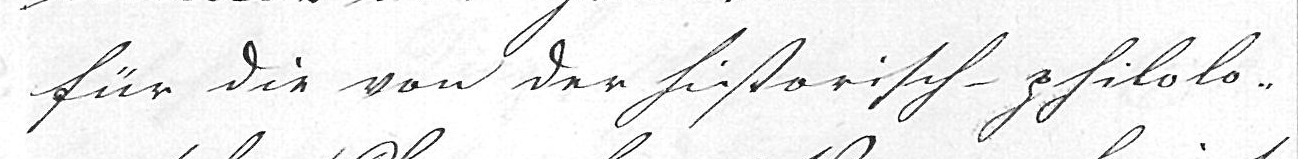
für die von der historische-philolo-
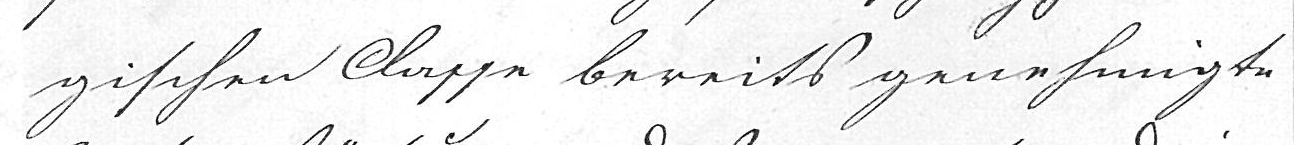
gischen Classe bereits genehmigte
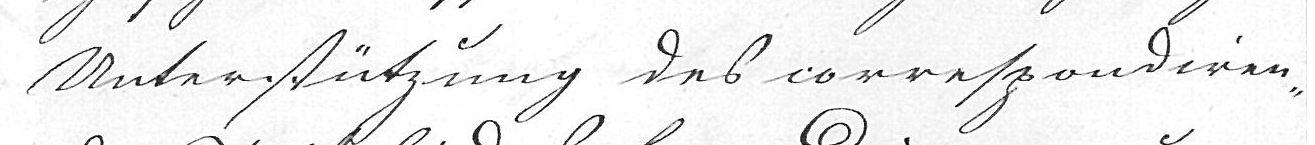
Unterstützung des correspondiren-
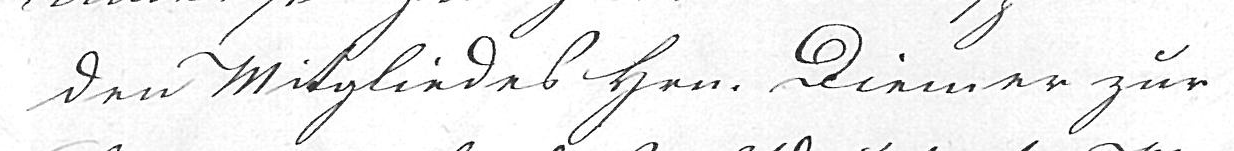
den Mitgliedes Hrn. Diemer zur
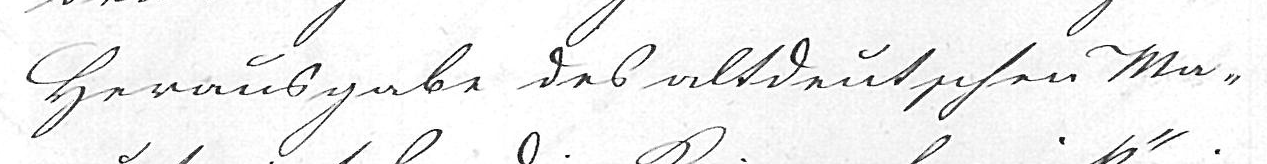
Herausgabe des altdeutschen Ma-
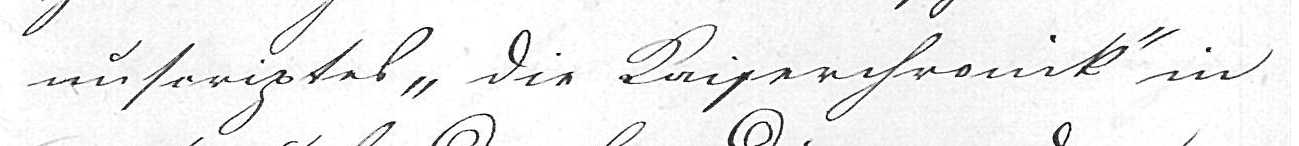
unscriptes "Die Kaiserchronik" in
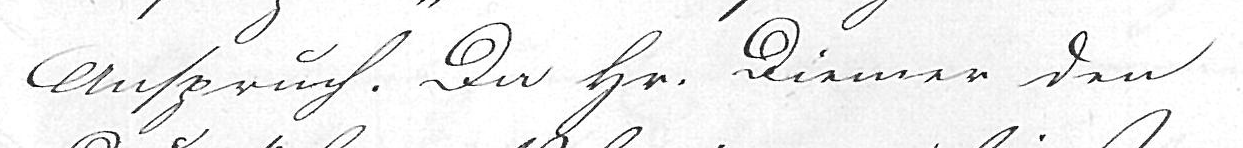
Anspruch. Da Hr. Diemer den
